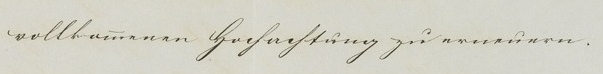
vollkommenen Hochachtung zu erneuern.
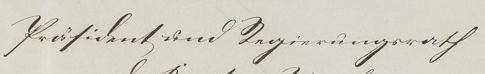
Präsident und Regierungsrath
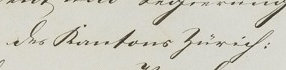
des Kantons Zürich:
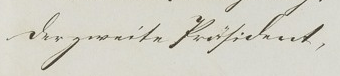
Der zweite Präsident,
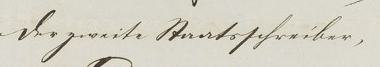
Der zweite Staatsschreiber,
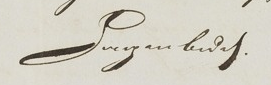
Hagenbuch.
